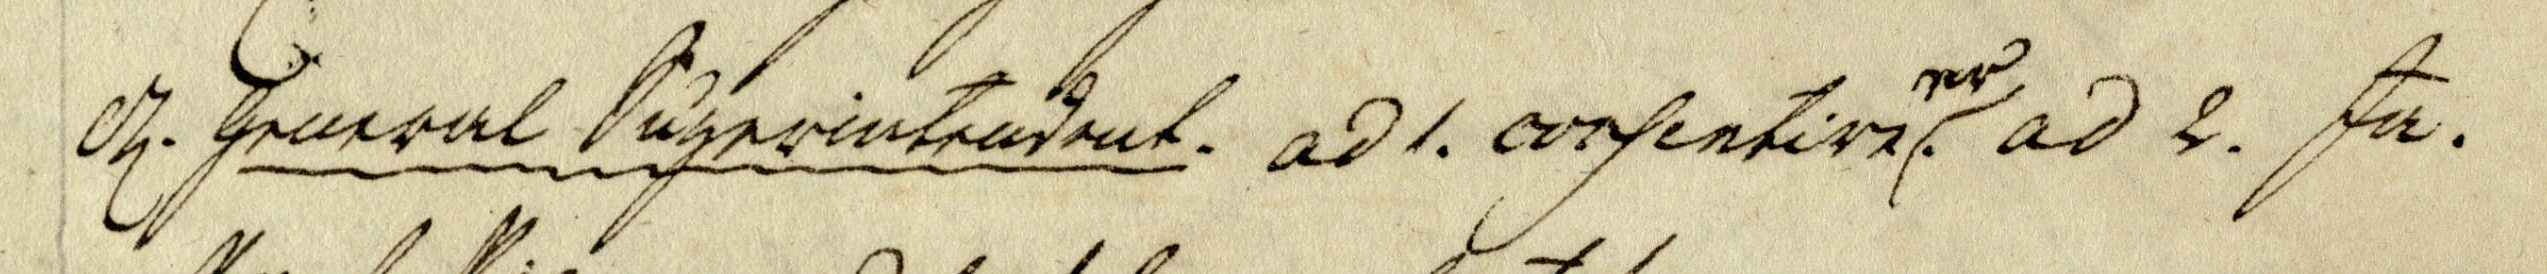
dh. General Superintendent. ad 1. corsentire er. ad 2. Ja.
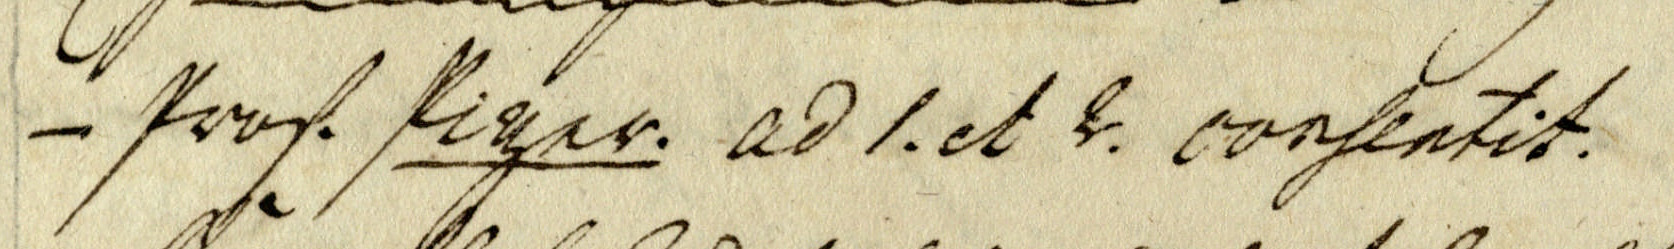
Prof. Piper. ad 1. et 2. consentit.
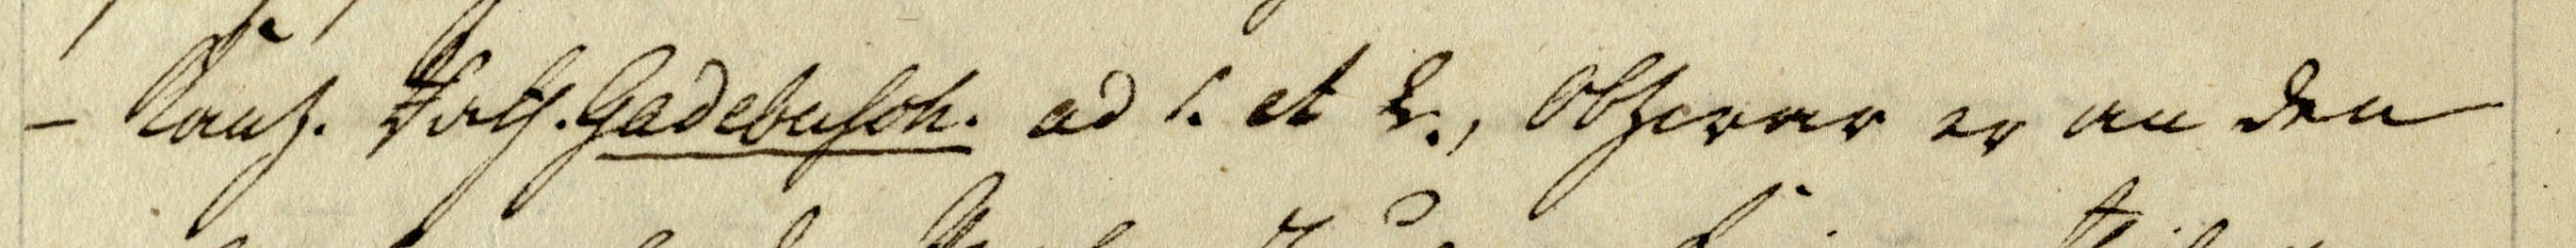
Kanz. Rath Gadebusch. ad 1. et 2., obzwar er an den
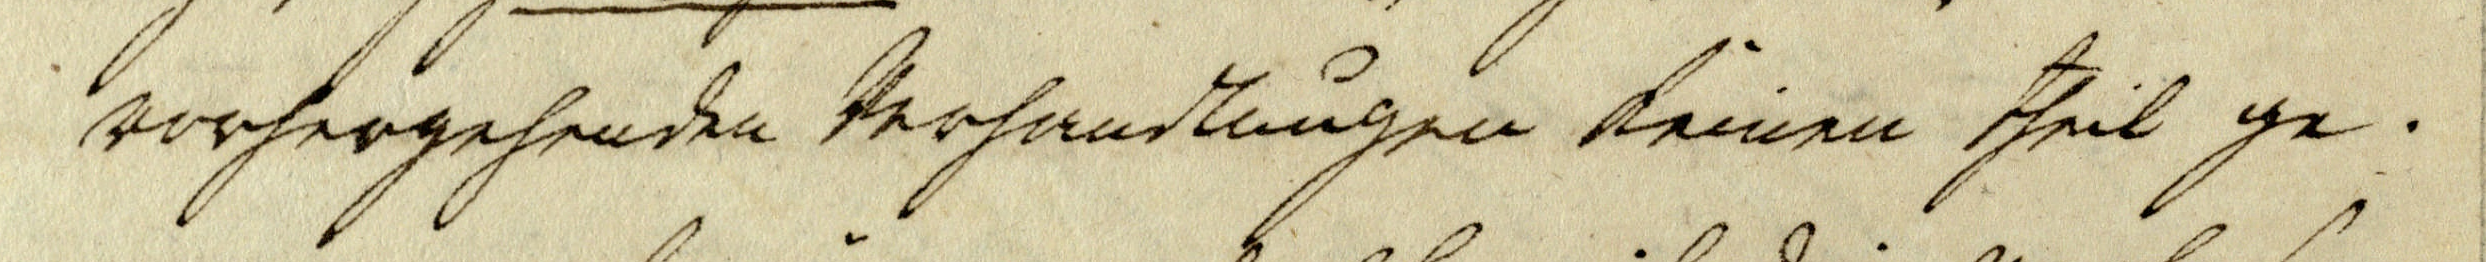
vorhergehenden Verhandlungen keinen Theil ge¬
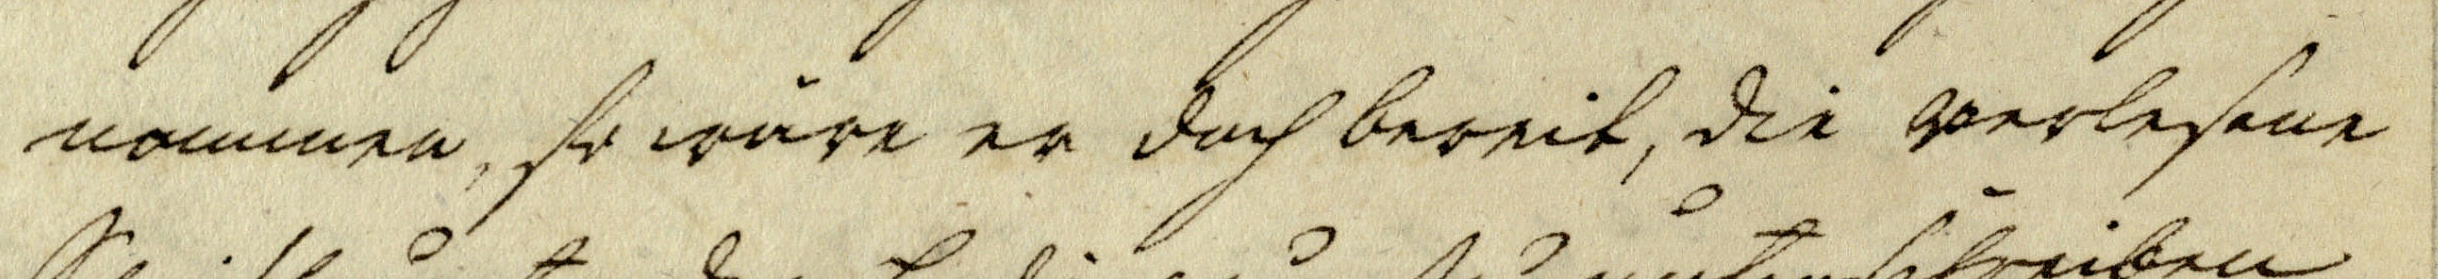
nommen, so wäre er doch bereit, die verlesene
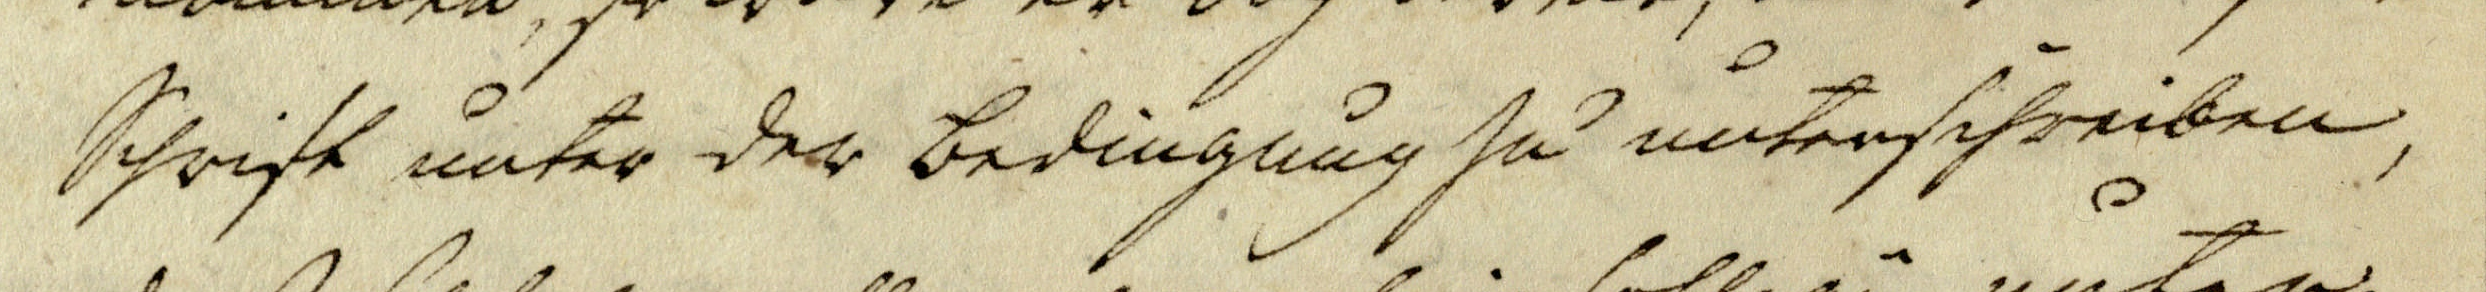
Schrift unter der Bedingung zu unterschreiben,
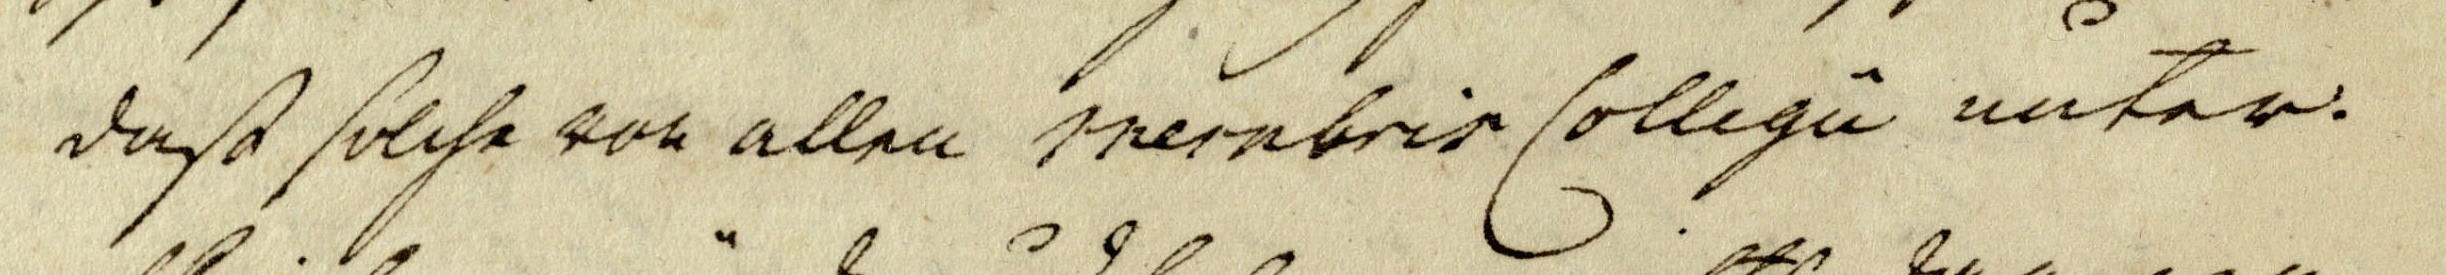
daß solche von allen Membris Collegii unter¬
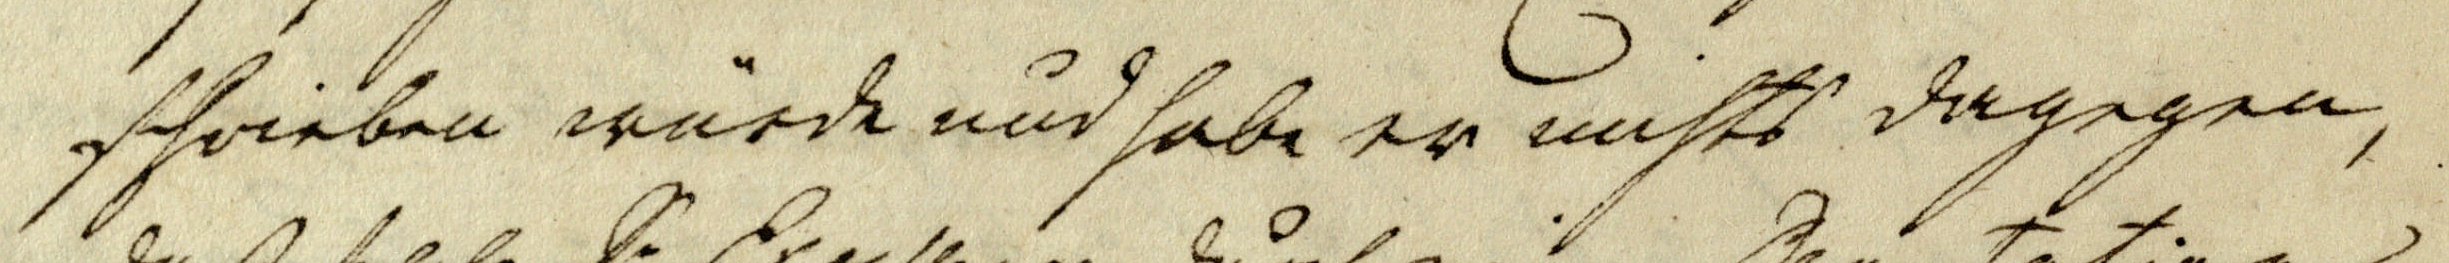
schrieben würde und habe er nichts dagegen,
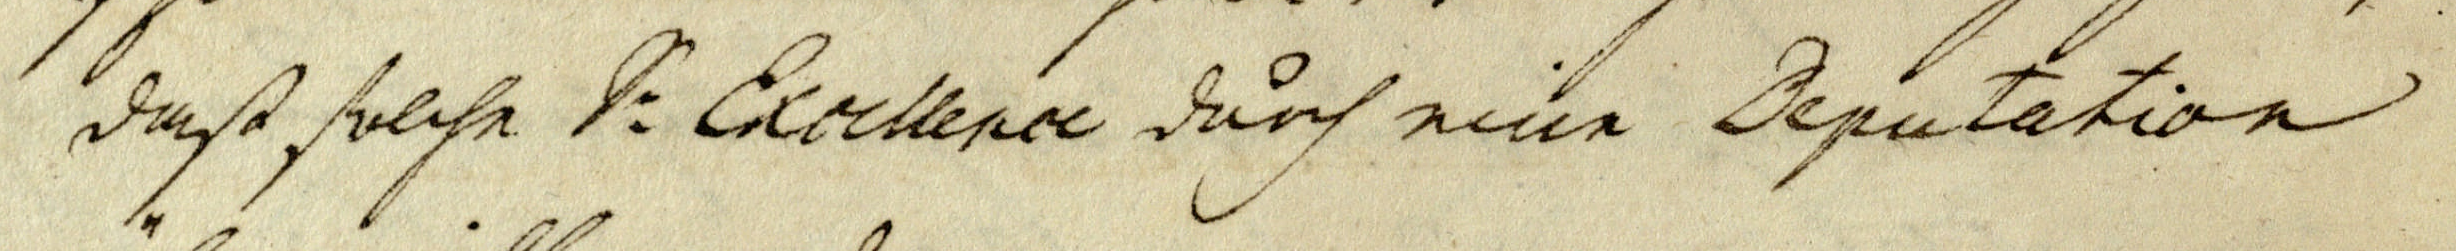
daß solche Sr. Excellence durch eine Deputation
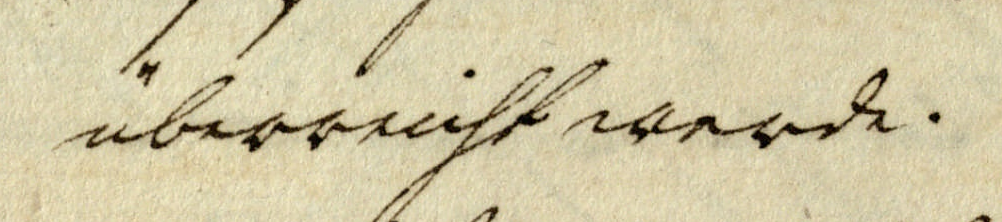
überreicht werde.
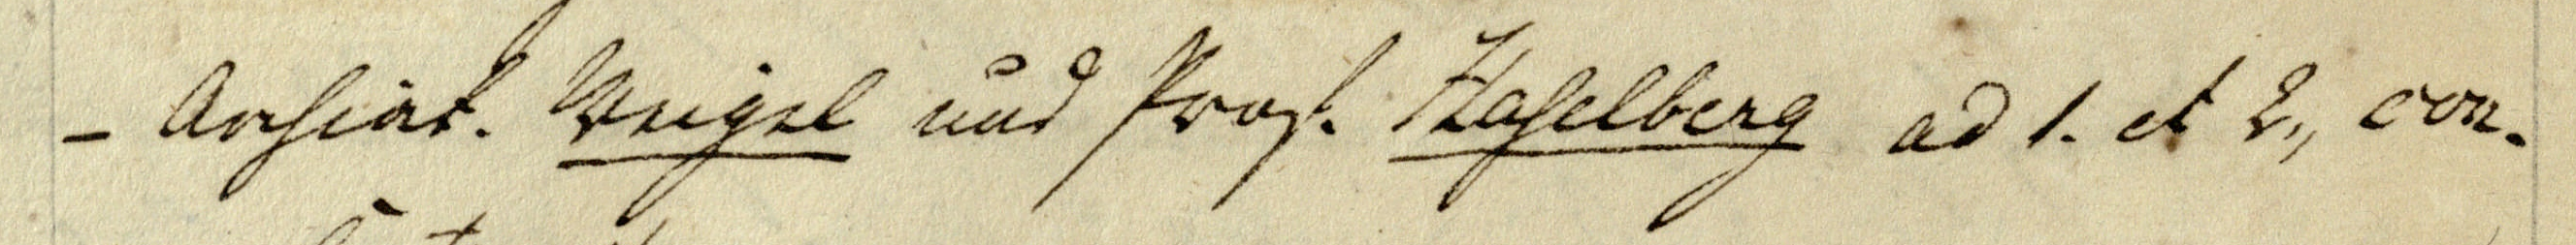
Archiat. Weigel und Prof. Haselberg ad 1. et 2, con¬
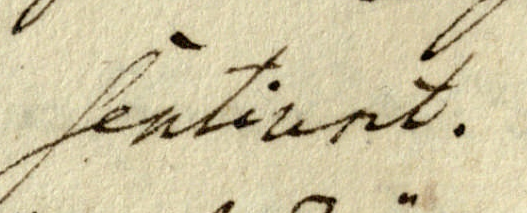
sentiunt.
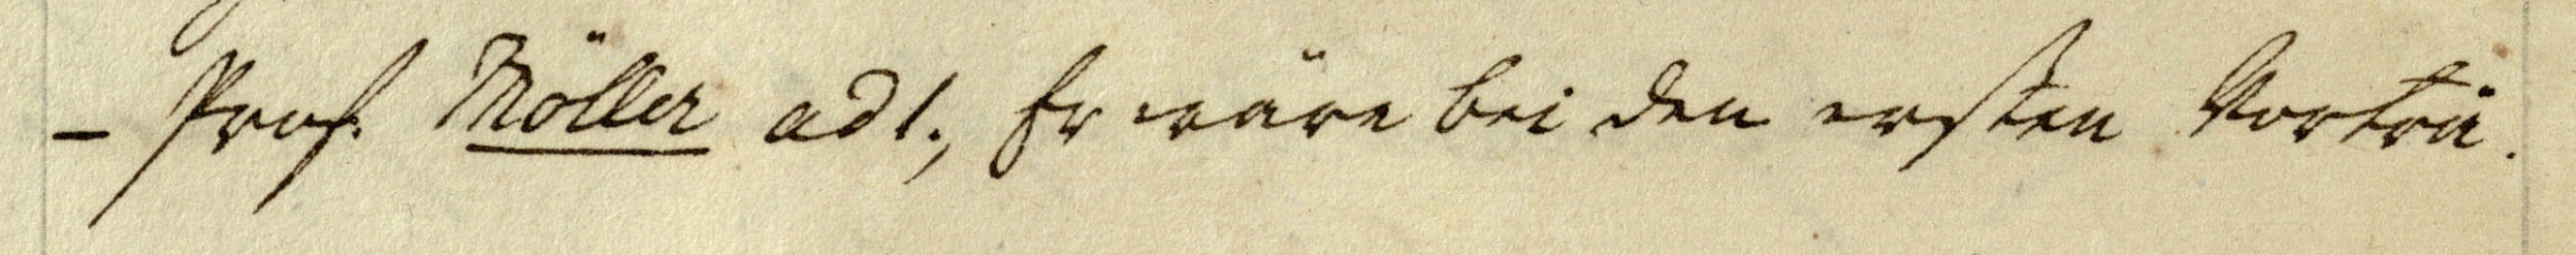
Prof. Möller ad 1., Er wäre bei den ersten Vorträ¬
